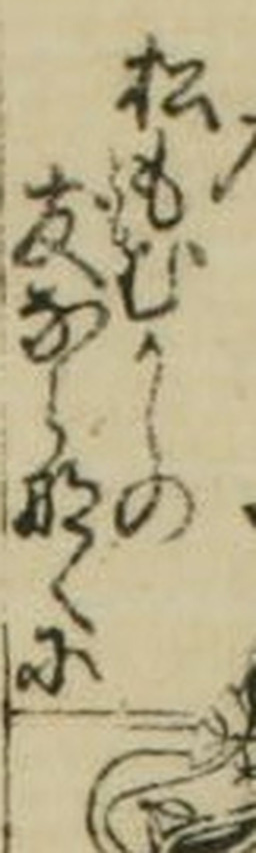友ならなくに
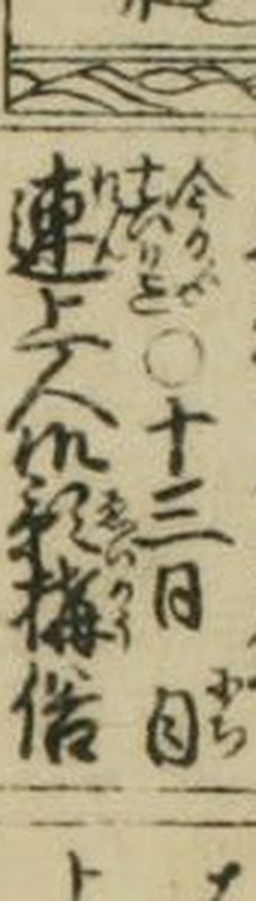連上人御影講俗
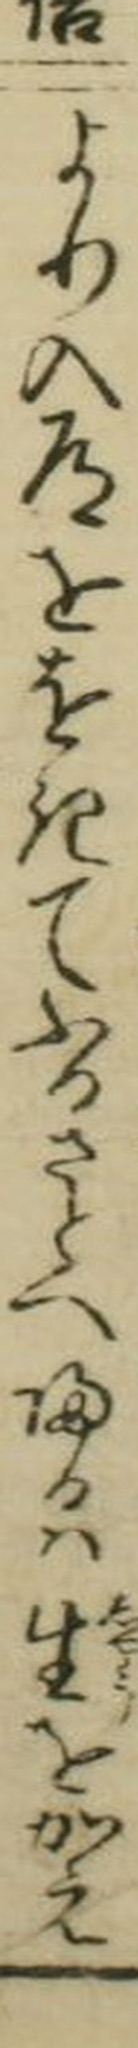より入道ををきてふるさとへ帰るは生をかえ
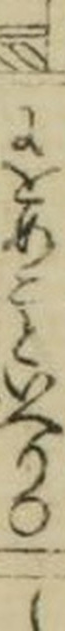にをめこといへり○
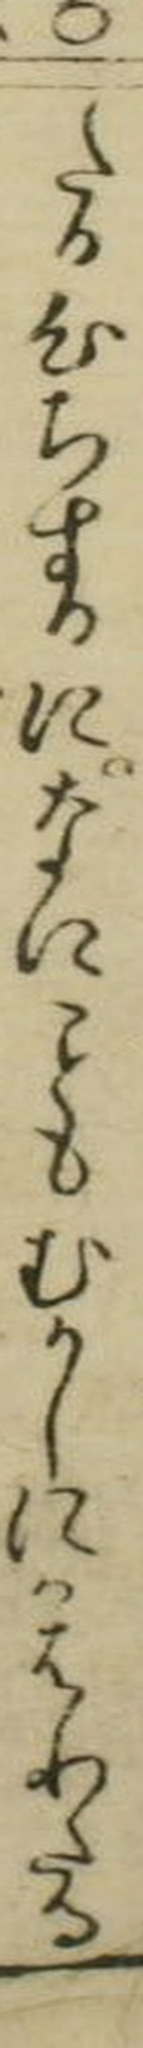たる心ちするに。なにこともむかしにかはりたる
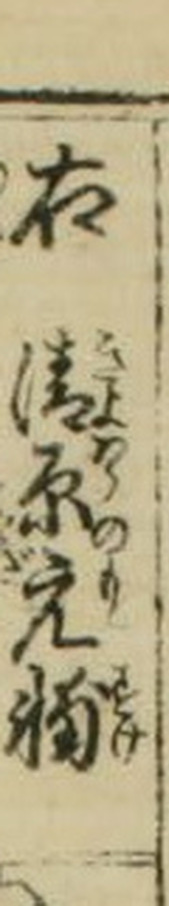右清原元輔
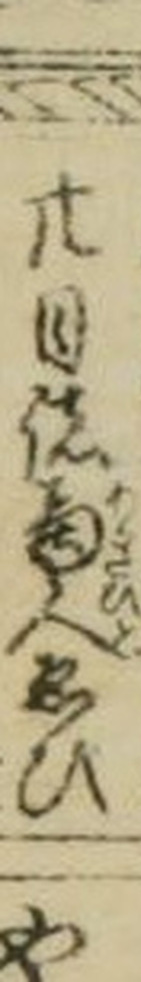廿日諸商人ゑひ
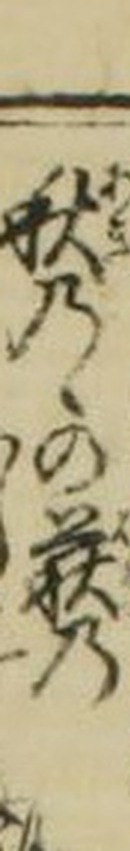秋のゝの萩の
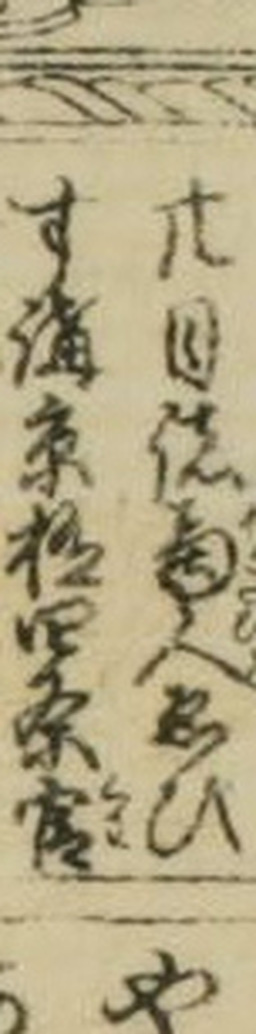す講京極四条官
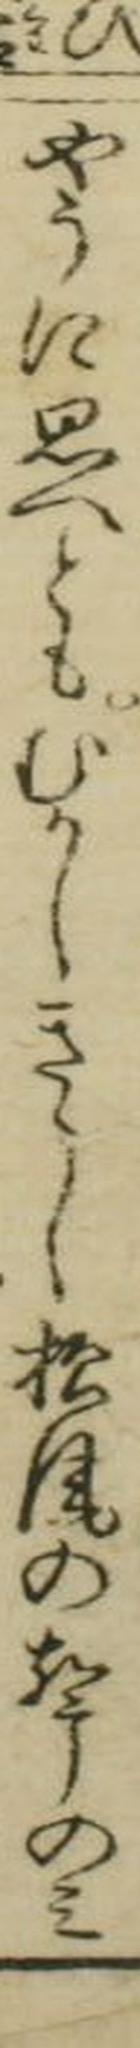やうに思へとも。むかしきゝし松風の声のみ
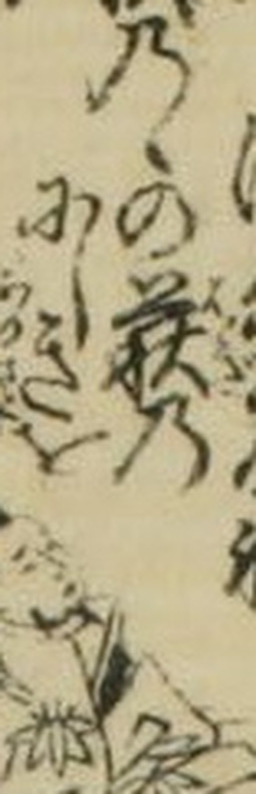にしきを
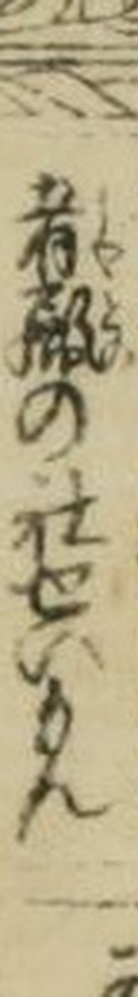者殿の社せいもん
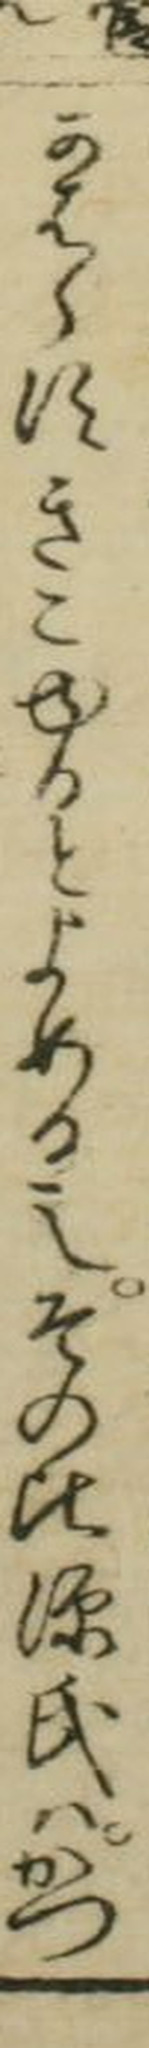かはらすきこゆるとよめる也。その比源氏は。かつ
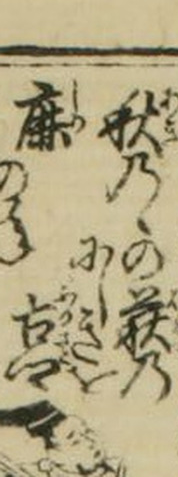秋のゝの萩の
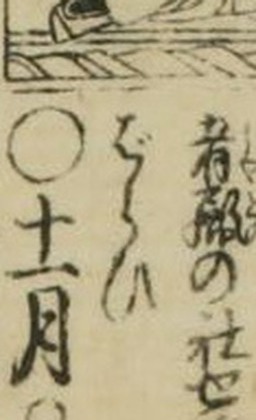ばらひ
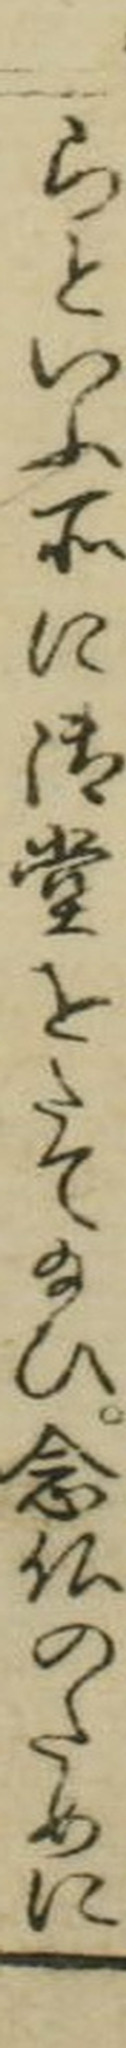らといふ所に御堂をたて給ひ。念仏のために
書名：女源氏教訓鑑
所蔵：東京学芸大学附属図書館
